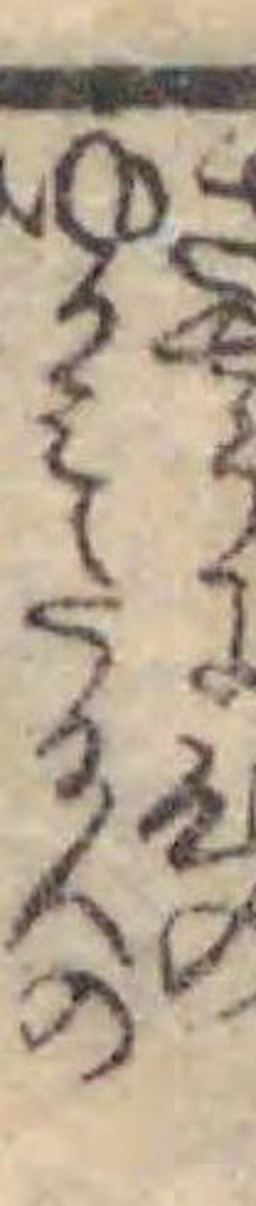ゆかみたる人の
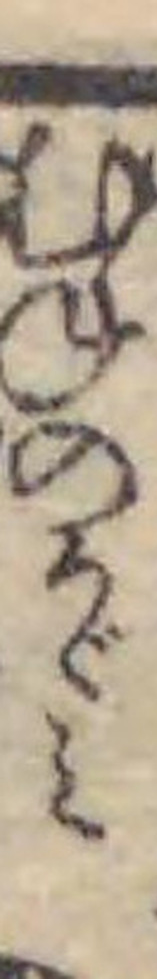むねのかゞみの
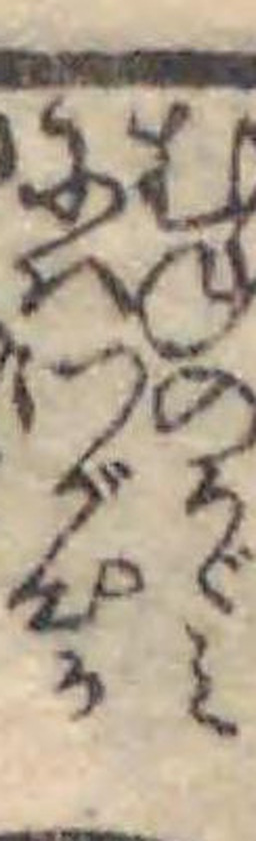にはわが心か
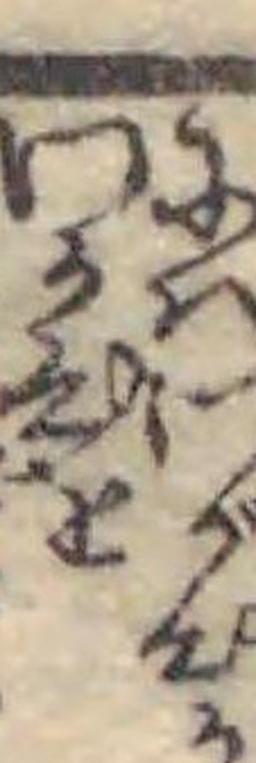わか心を
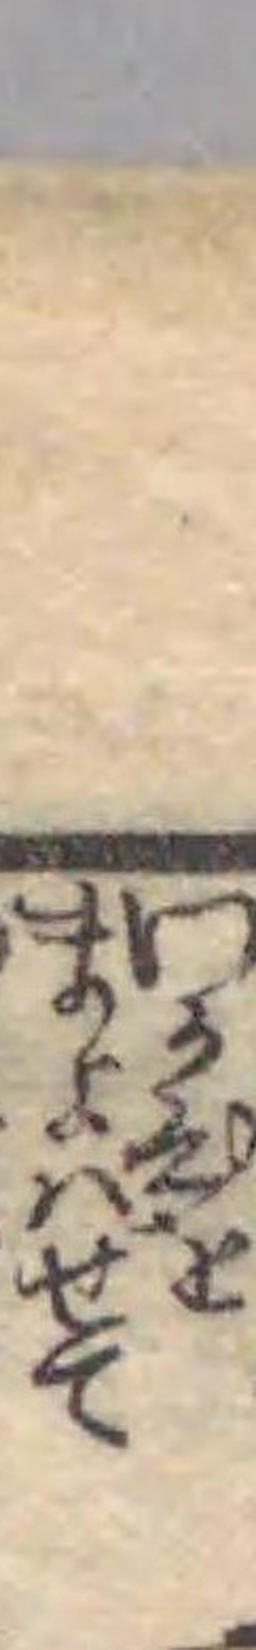まよはせて
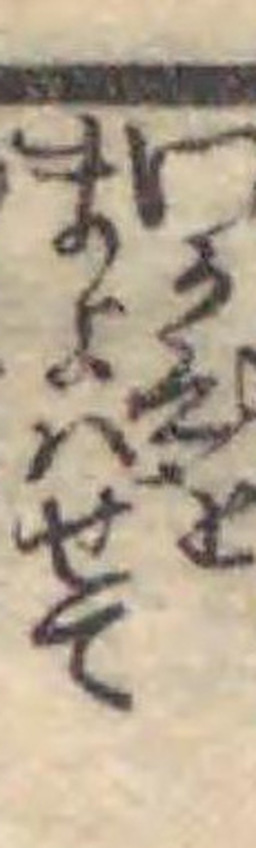まよはせて
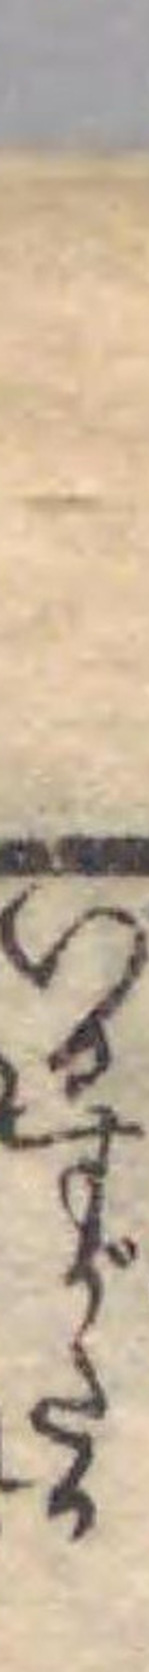いるすがたか
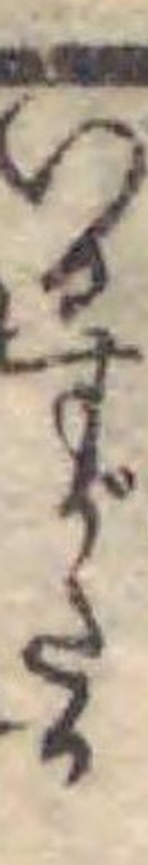いるすがたか
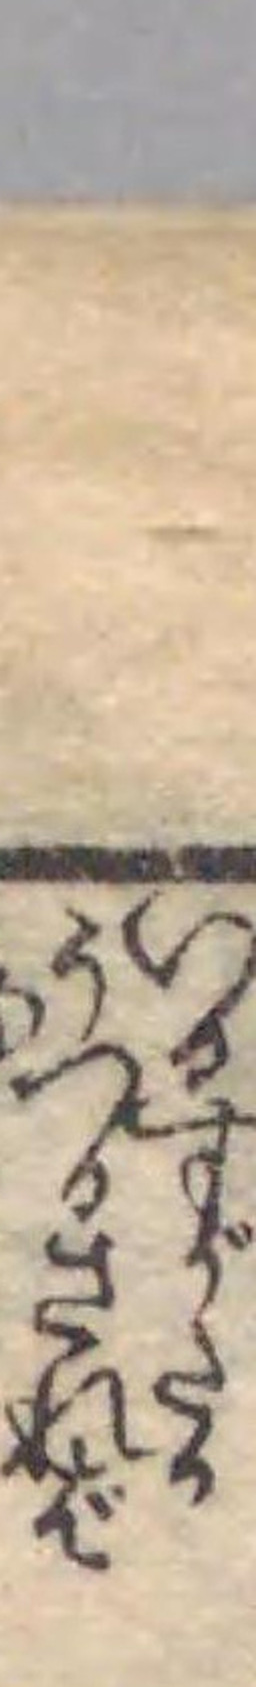うつるされば
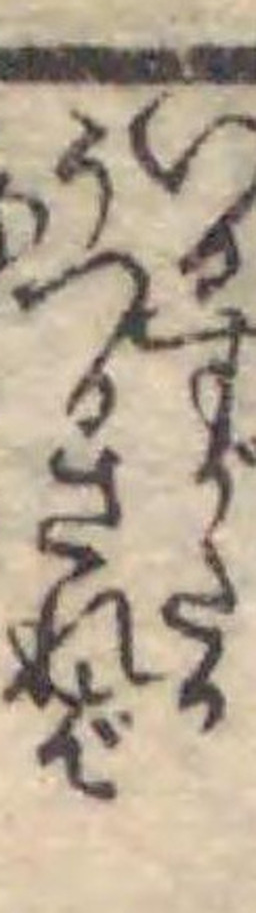うつるされば
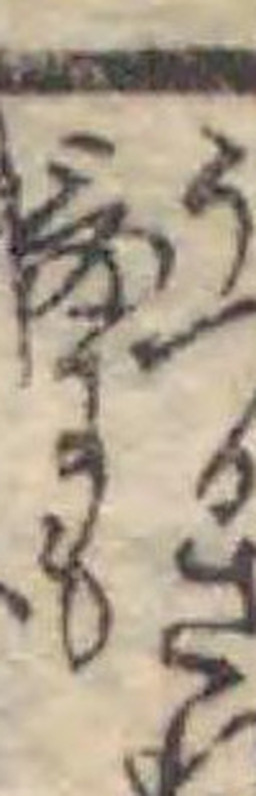哥にも
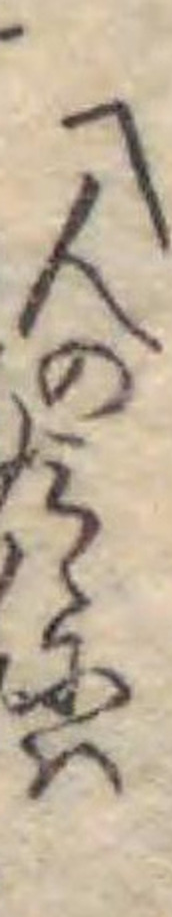〽人のみゝには
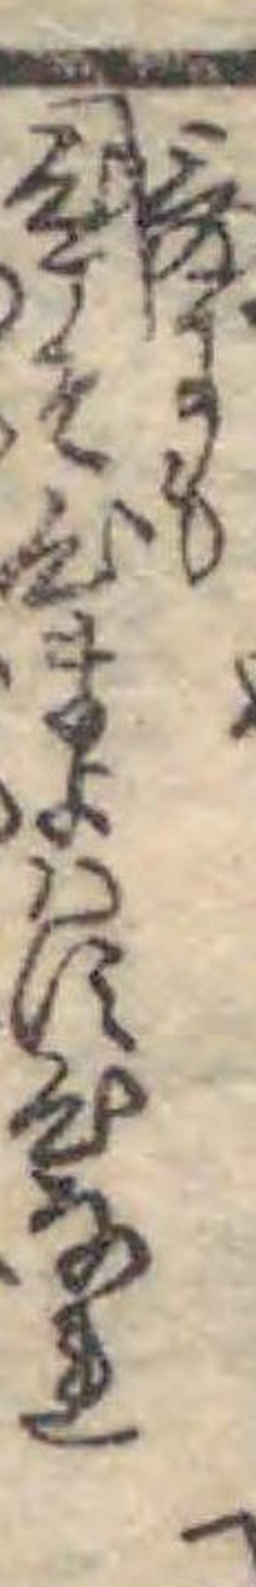〽心こそ心まよはす心なれ
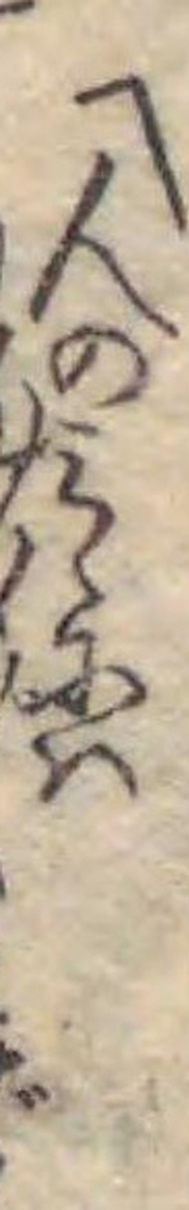〽人のみゝには
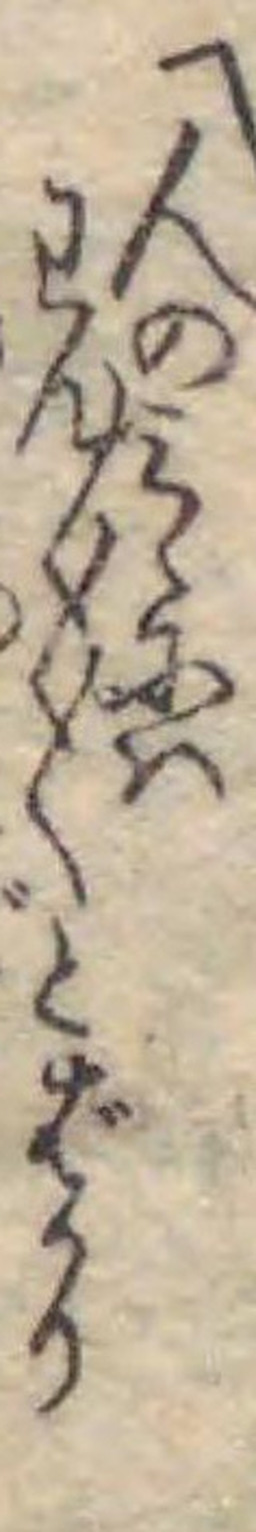わん〳〵〳〵〳〵とばかり
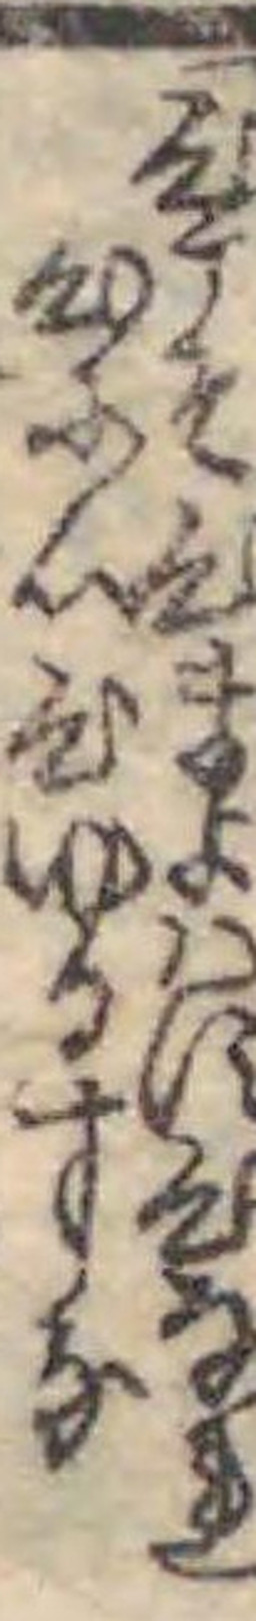心に心心ゆるすな
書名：人心鏡写絵 : 3巻
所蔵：国立国会図書館 National Diet Library, JAPAN
